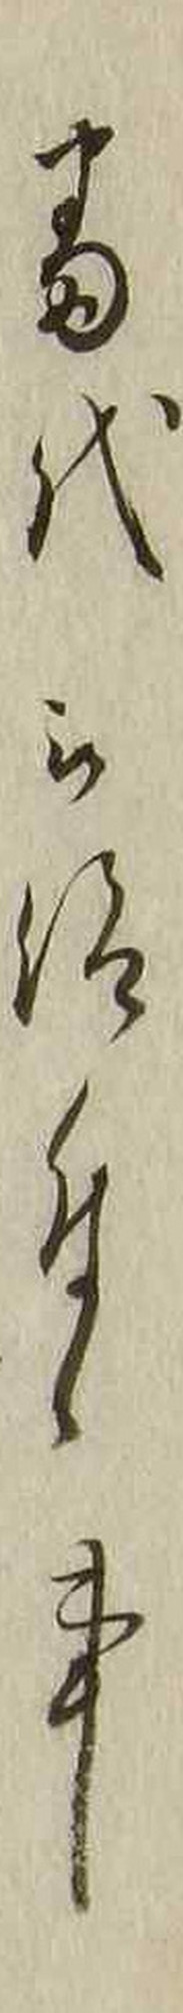番代被仰付候事
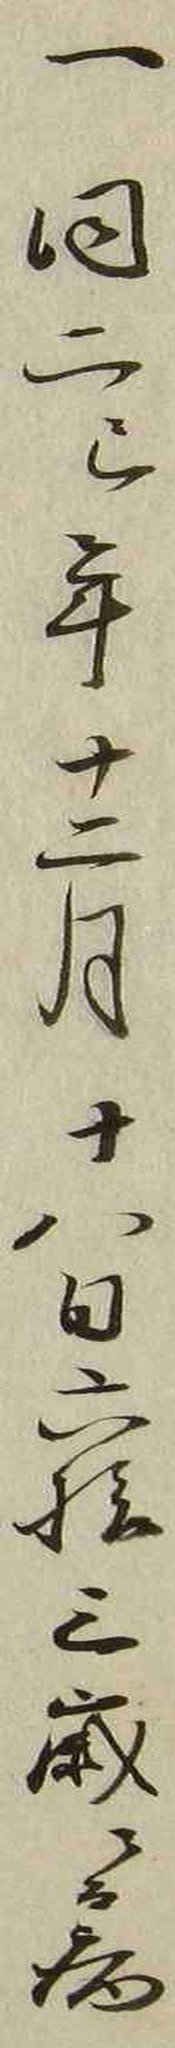一同二巳年十二月十八日六拾三歳ニ而病
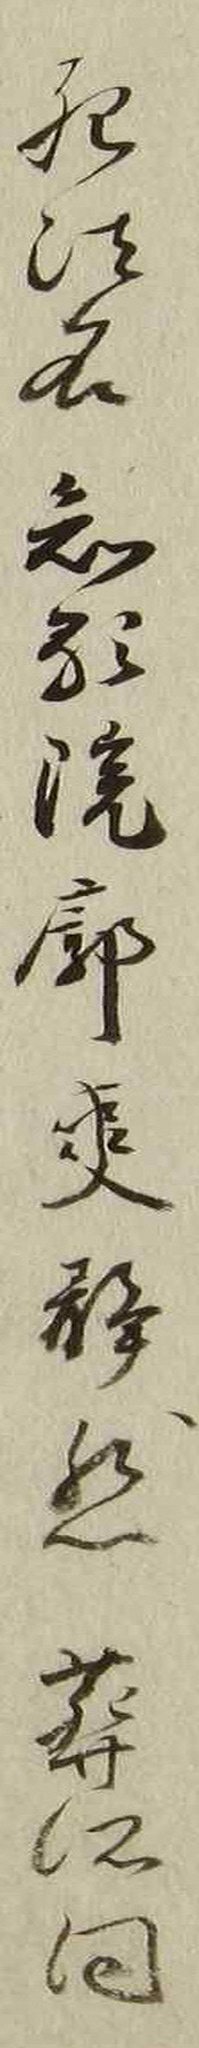死法名知顕院廓爽静然葬所同
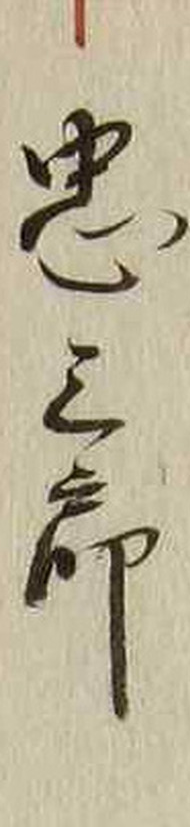忠三郎
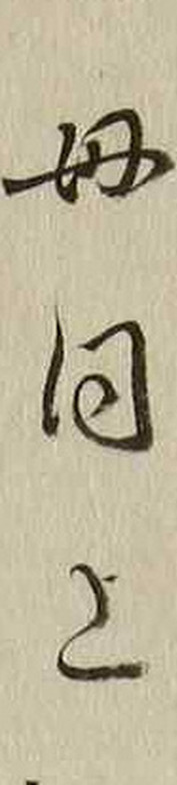母同上
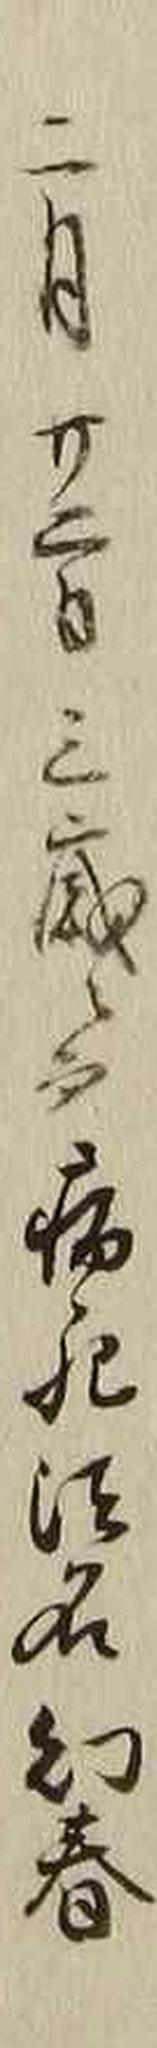二月廿二日三歳ニ而病死法名幻春
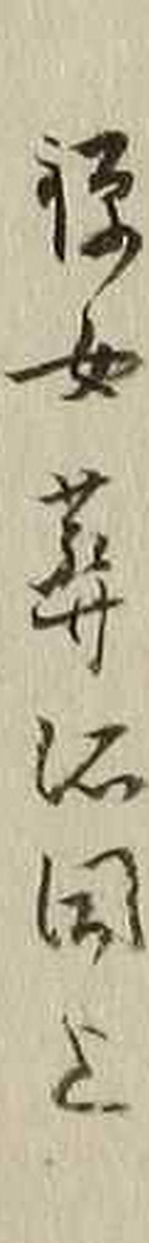禅女葬所同上
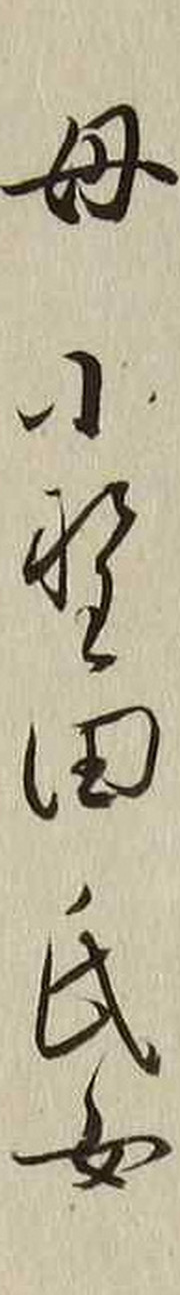母小野田氏女
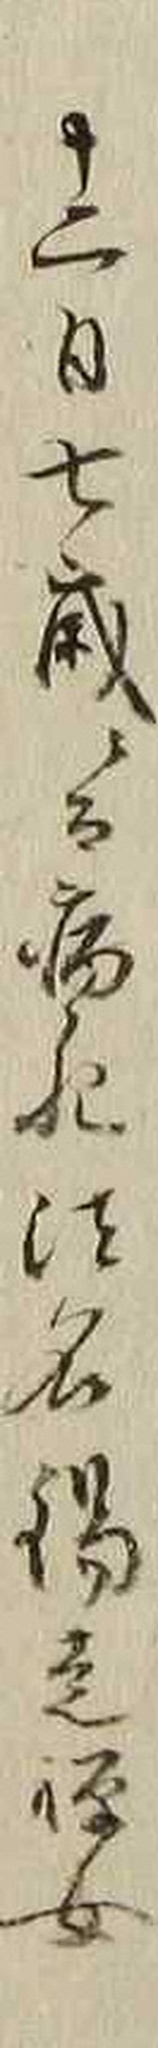十二日七歳ニ而病死法名錫走禅女
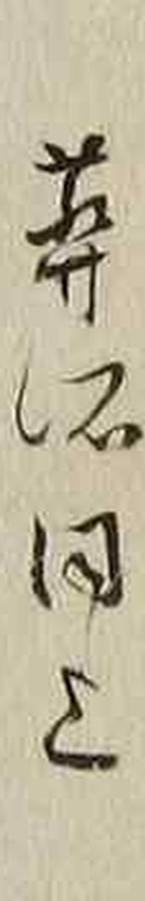葬所同上
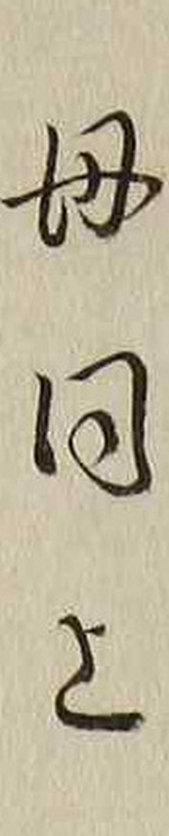母同上
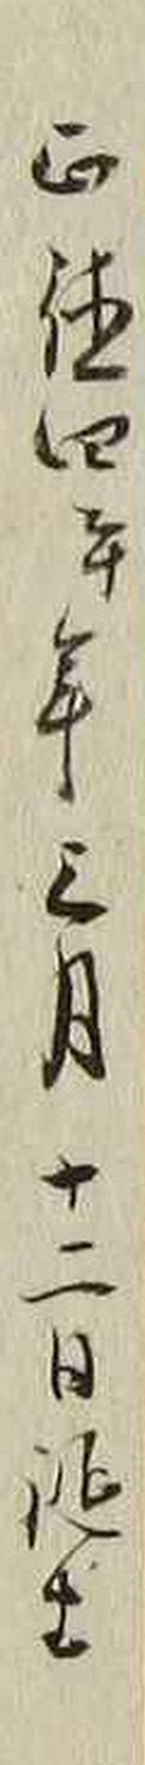正徳四午年三月十二日誕生
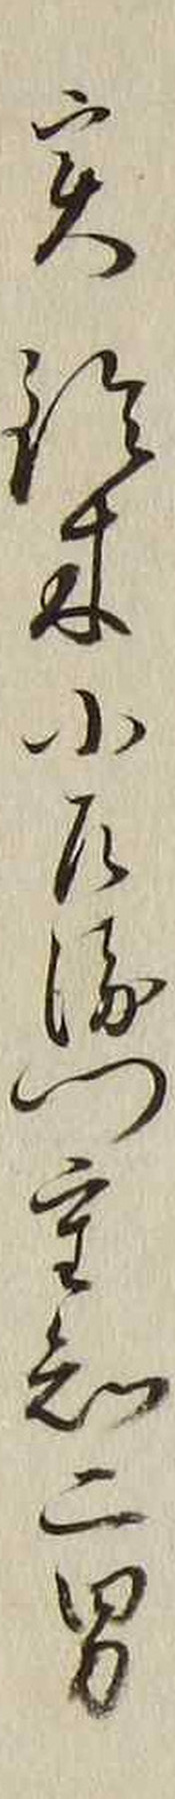実鈴木小左衛門重知二男
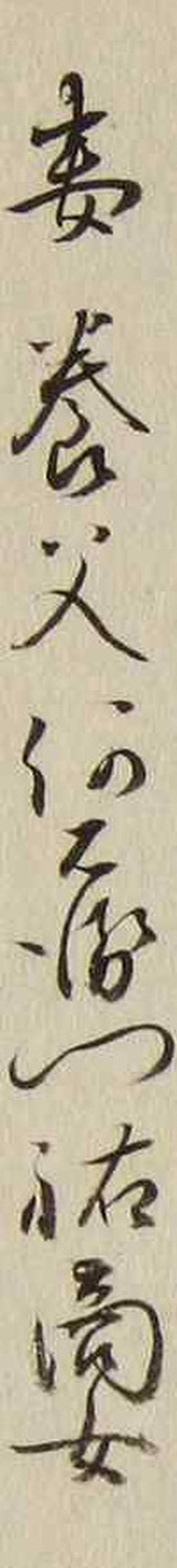妻養父何右衛門祐商女

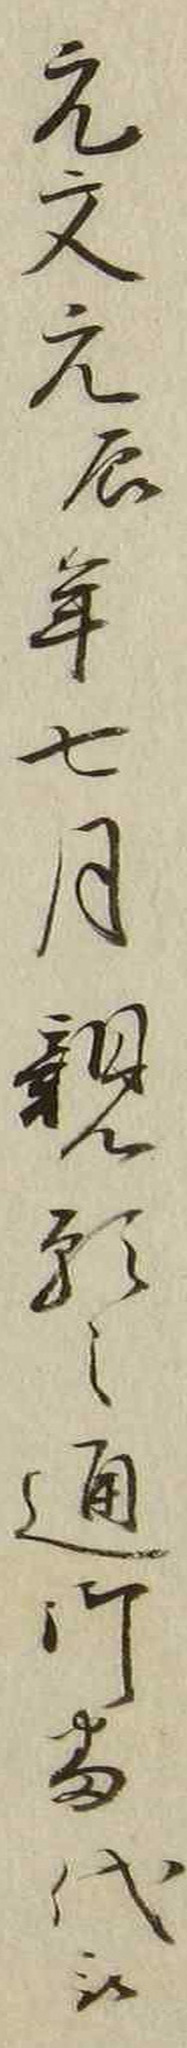元文元辰年七月親願之通御番代被
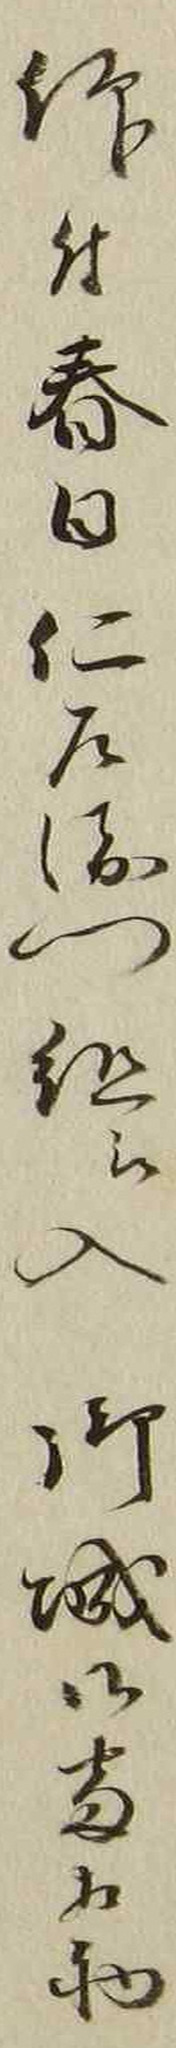仰付春日仁左衛門組江入御城御番相勤
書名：諸士系譜　巻之25　い之部25
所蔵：会津若松市立会津図書館
